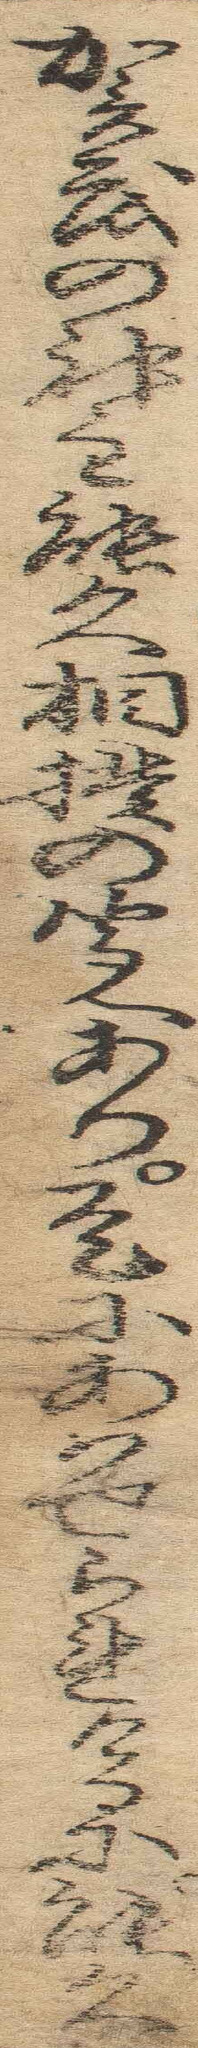加茂の神主能久相撲の聞へあり。是にあはせられけるに。能久

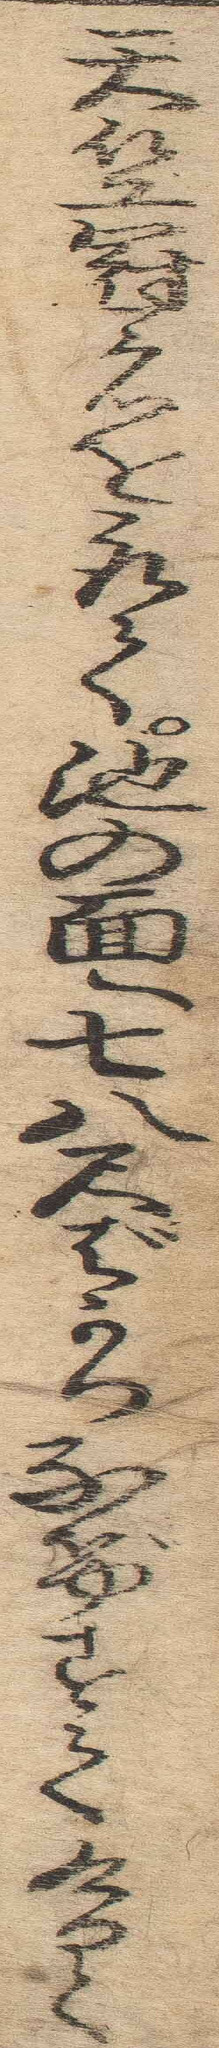天笠冠者を取て。池の面へ七八尺ばかりなげすてけると
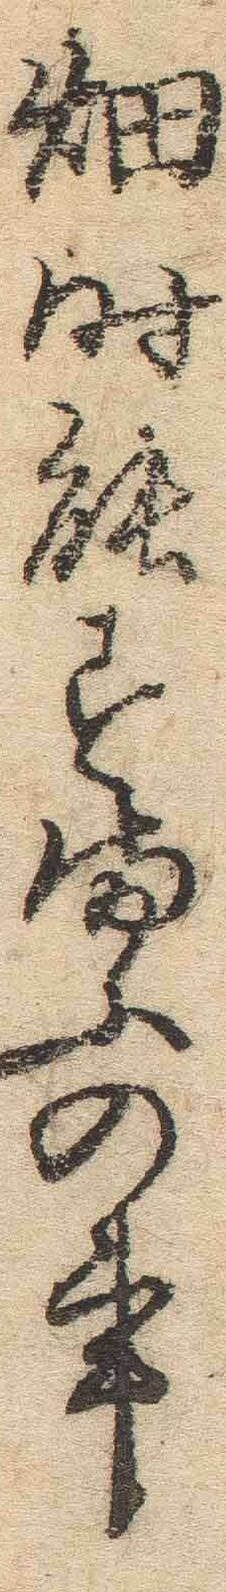畑時能相撲の事
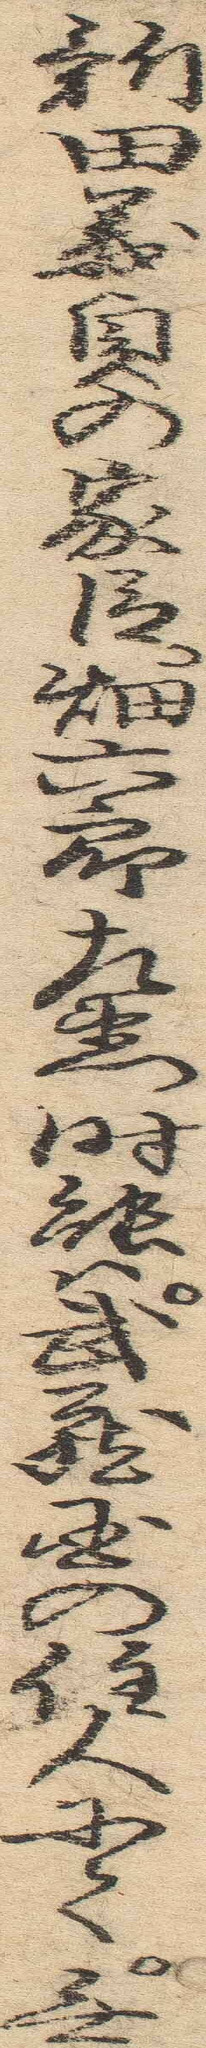新田義貞の家臣。畑六郎左衛門時能は。武蔵国の住人にて。無
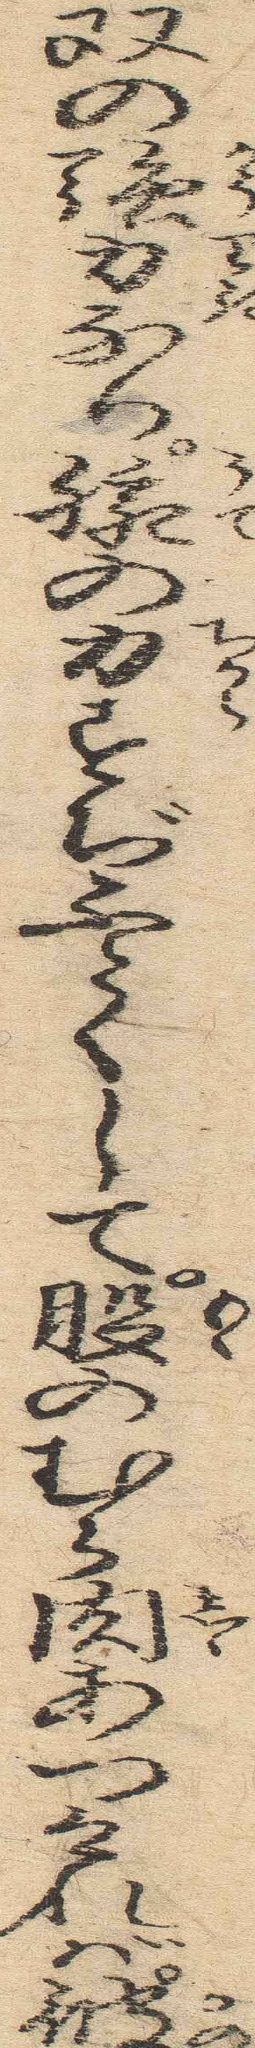双の強力なり。腕の力すぢふとくして。股のむら肉あつければ彼
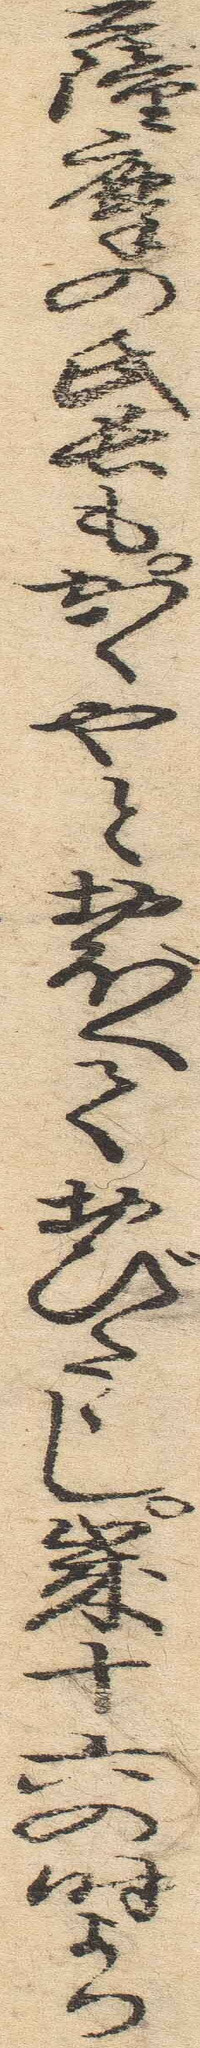薩摩の氏長も。かくやとおぼへておびたゞし。歳十六の時より
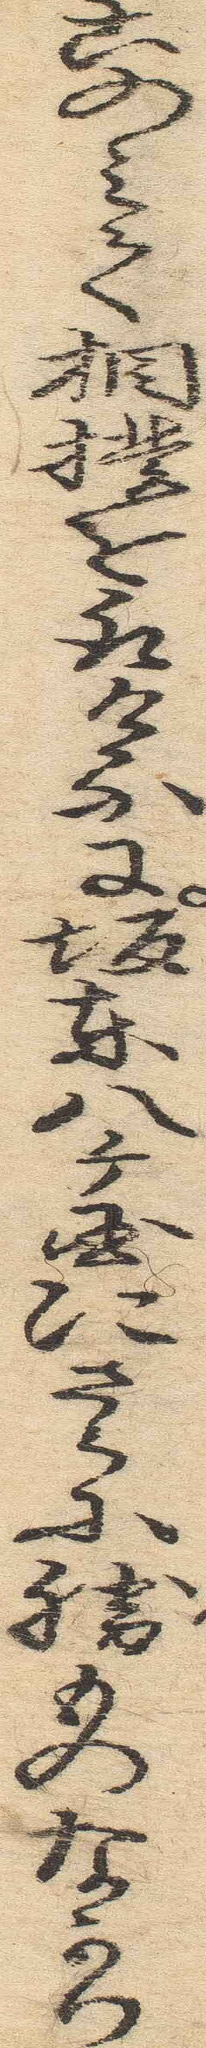このみて相撲を取けるに。板東八ヶ国にさらに勝ものなかり
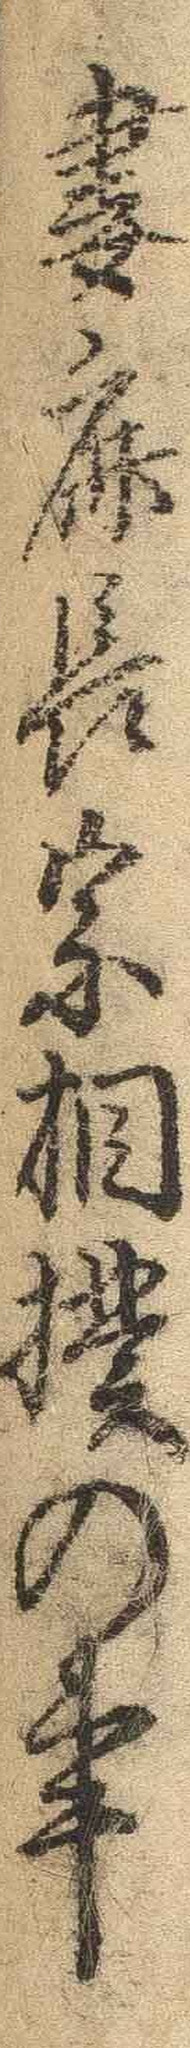妻鹿長宗相撲の事
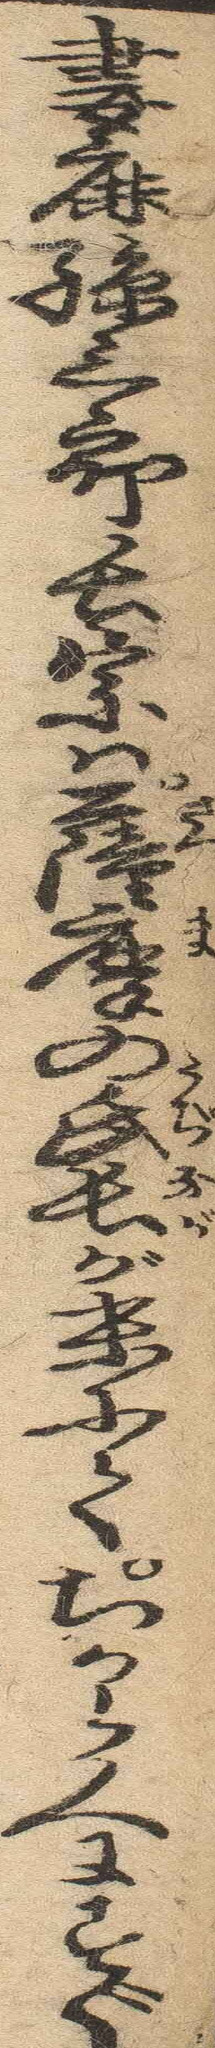妻鹿孫三郎長宗は。薩摩の氏長が末にて。ちから人にすぐ
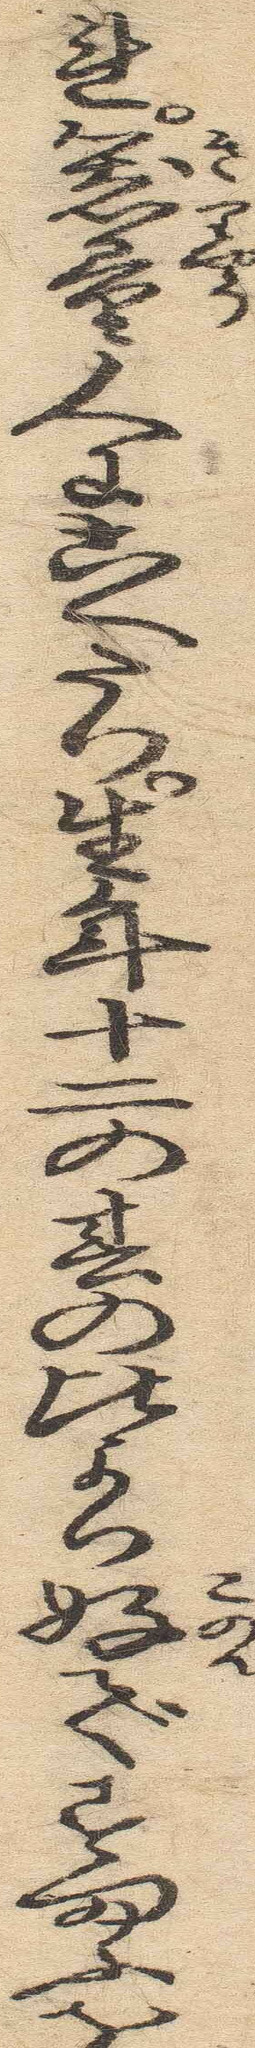れ。器量人にこへたり。生年十二の春の比より好ですまふを
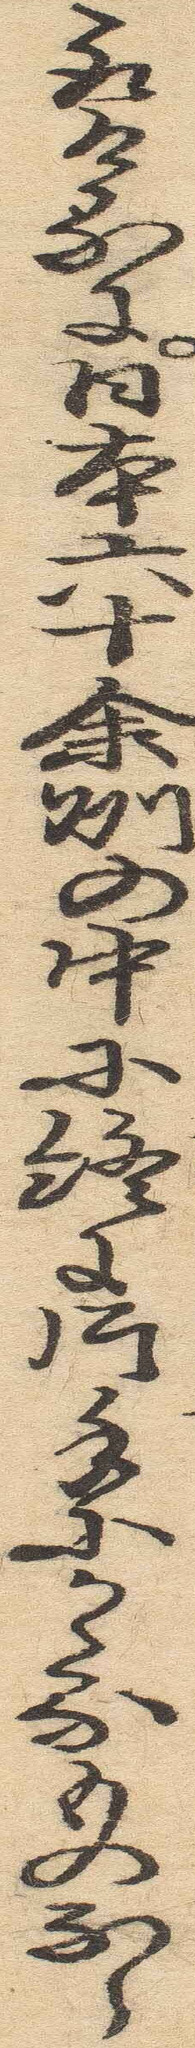取けるに。日本六十余州の中に終に片手にかゝるものなし
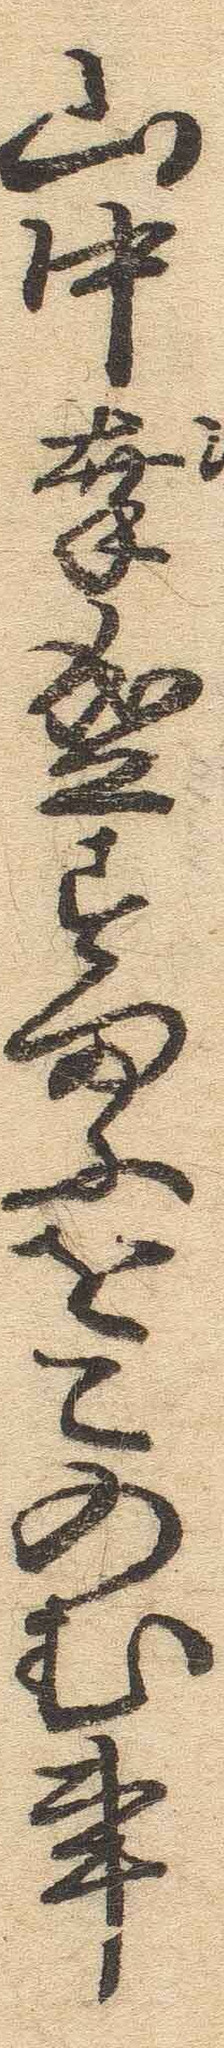山中幸盛すまふをこのむ事
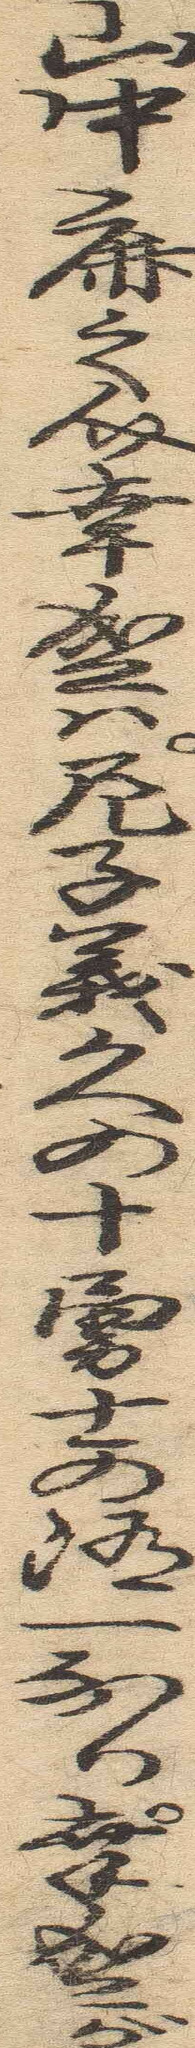山中鹿之介幸盛は尼子義久の十勇士の隋一なり。幸盛が
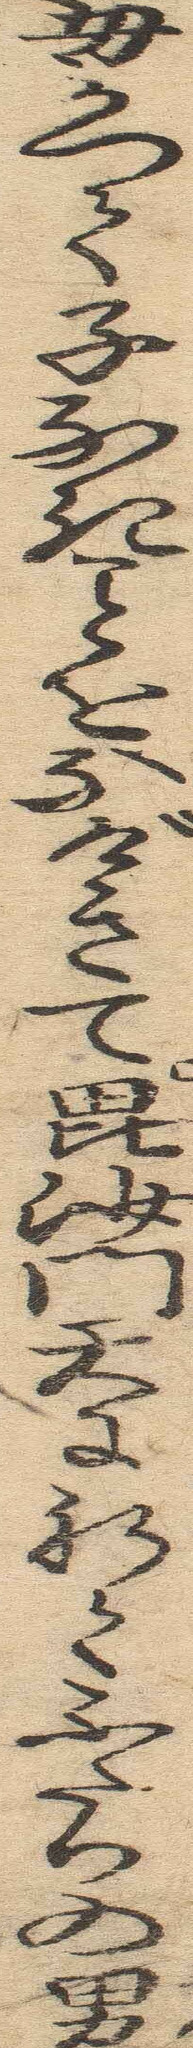母かつて子なきことをなげきて。毘沙門天に祈てふたりの男
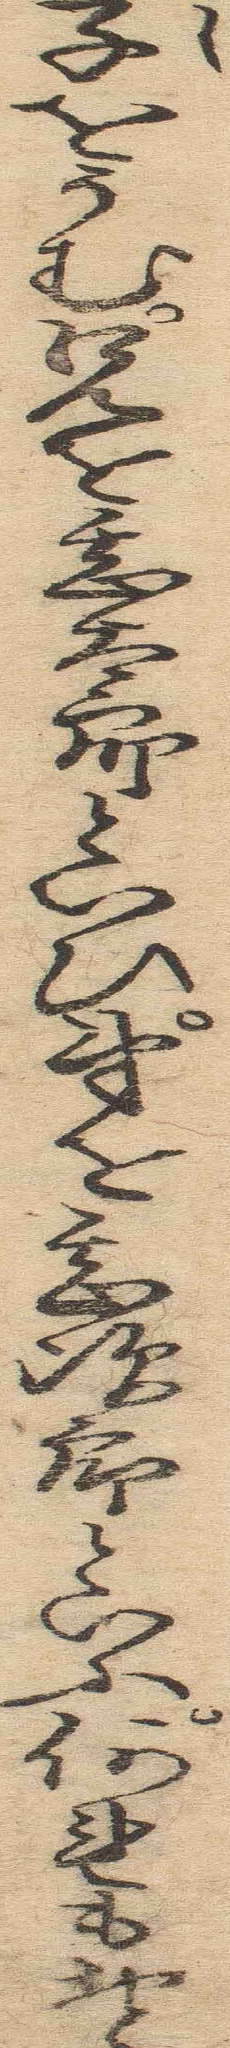子をうむ。兄を甚太郎といひ弟を甚次郎といふ。何れもおと
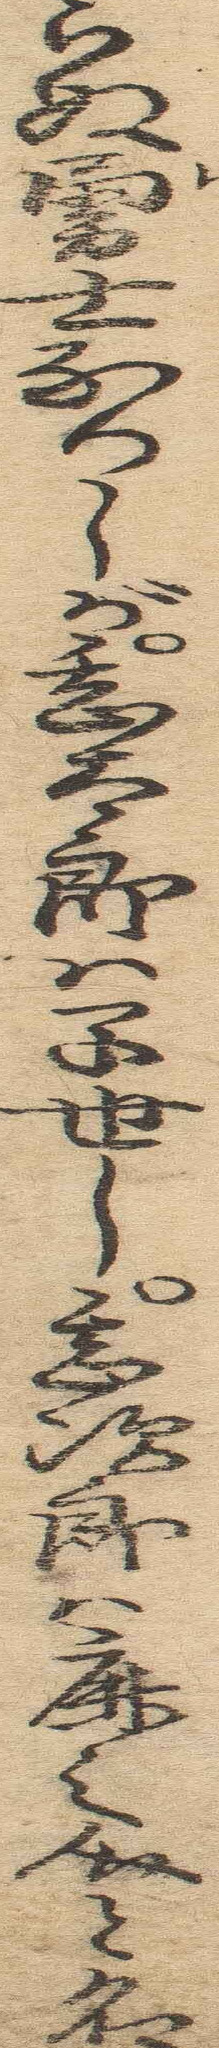らぬ勇士なりしが。甚太郎は早世し甚次郎は鹿之介と名
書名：古今相撲大全
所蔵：東京学芸大学附属図書館 国文学研究資料館
